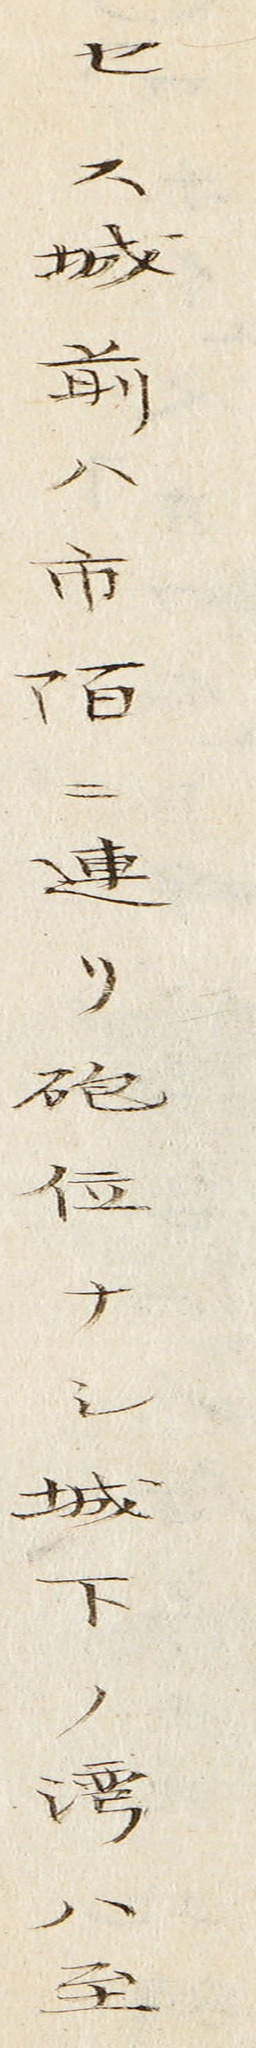セス城前ハ市陌ニ連リ砲位ナシ城下ノ湾ハ至
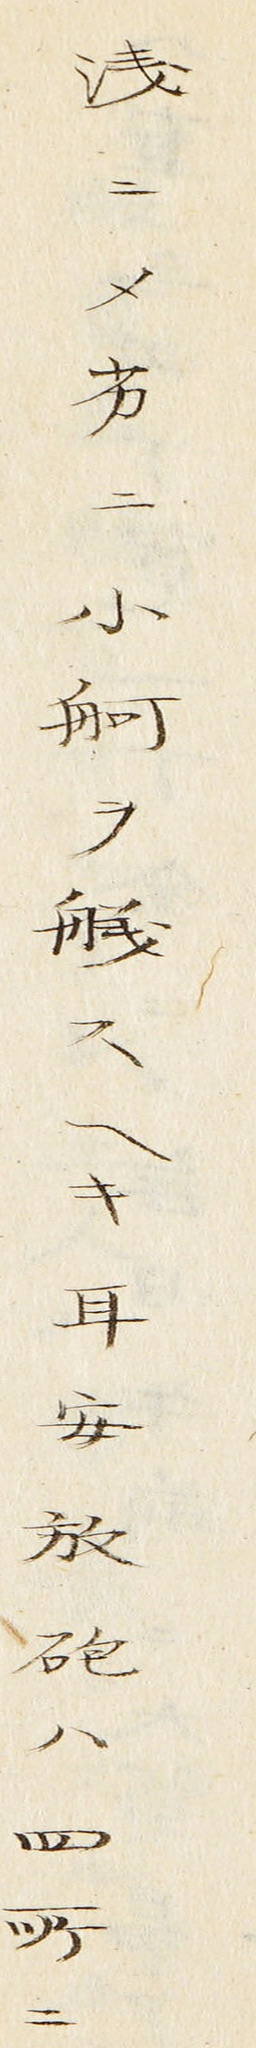浅ニシテ劣ニ小舸ヲ艤スヘキ耳安放砲ハ四所ニ
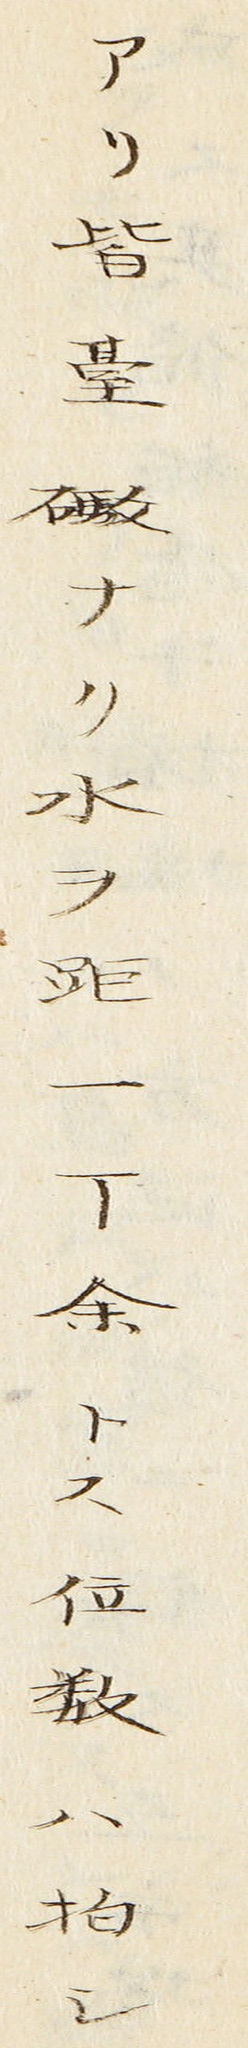アリ皆台礟ナリ水ヲ距一丁余トス位数ハ拍シ
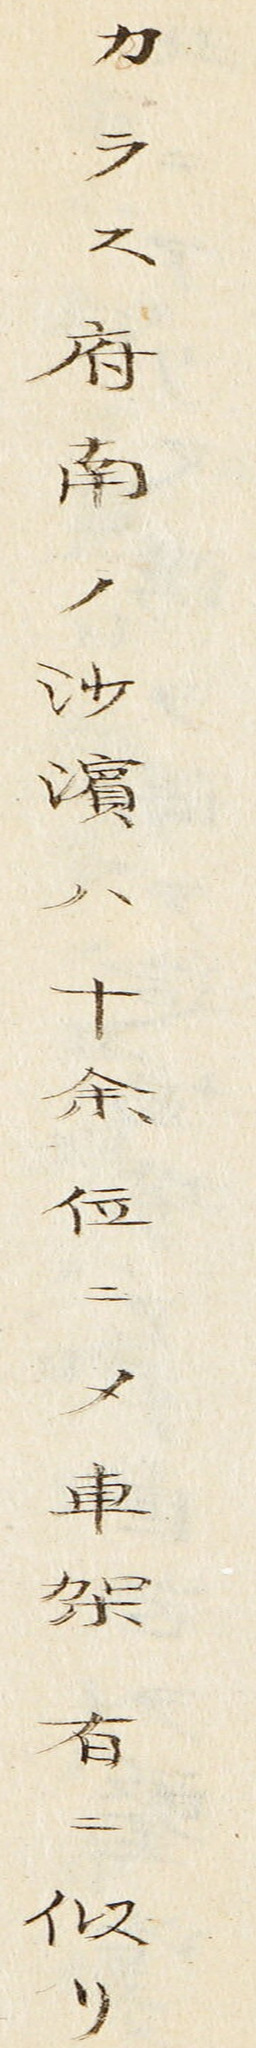カラス府南ノ沙浜ハ十余位ニシテ車架有ニ似リ
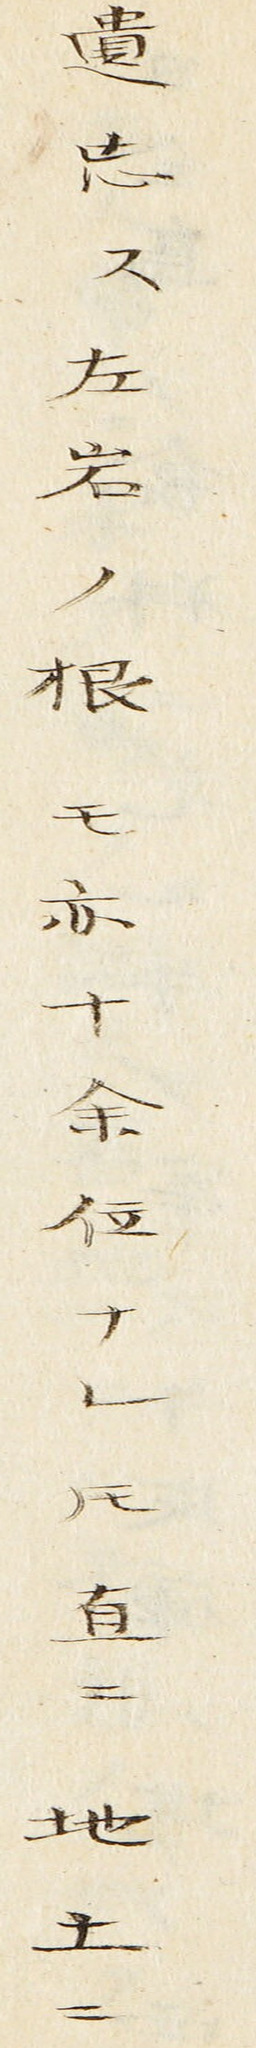遺志ス左岩ノ根モ亦十位ナレトモ直ニ地土ニ
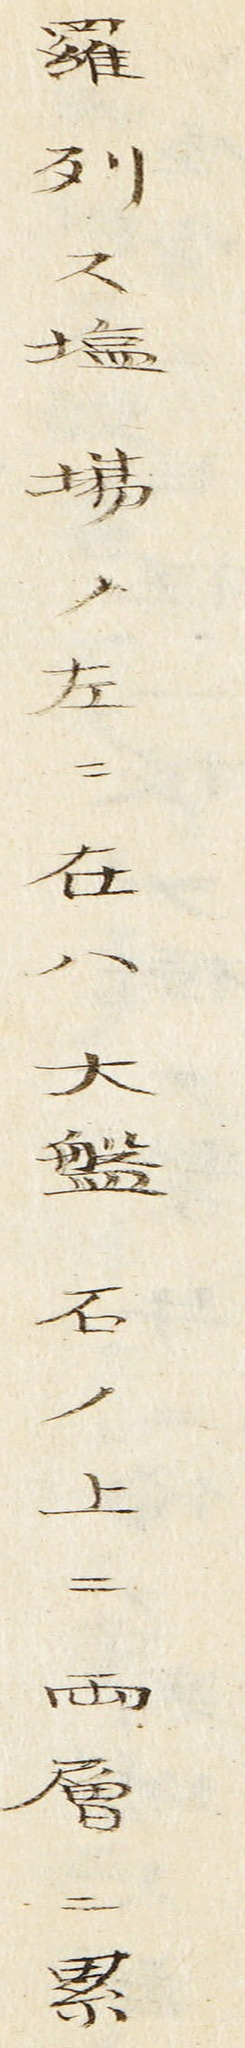羅列ス塩場ノ左ニ在ハ大盤石ノ上ニ両層ニ累
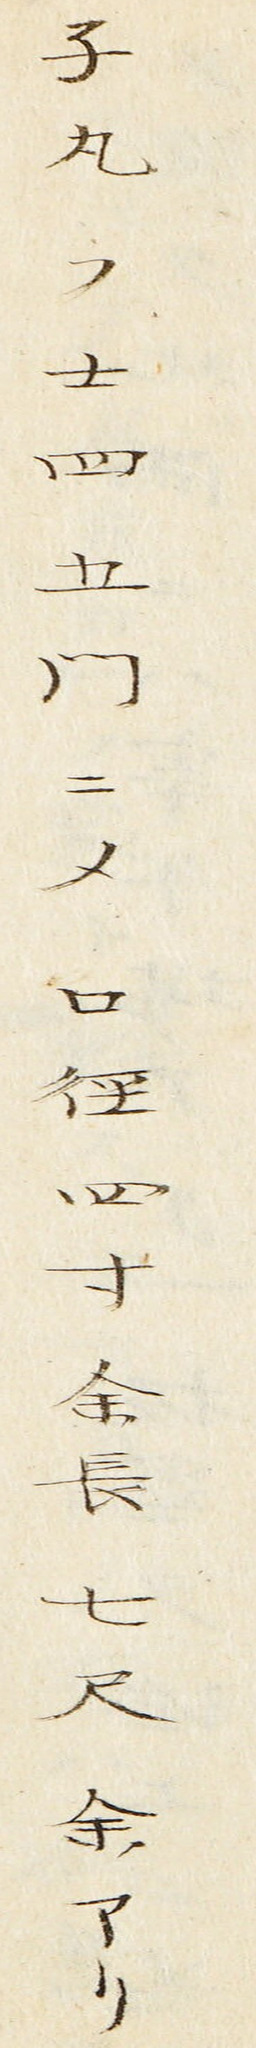子丸フ士四五門ニシテ口径四寸余長七尺余アリ
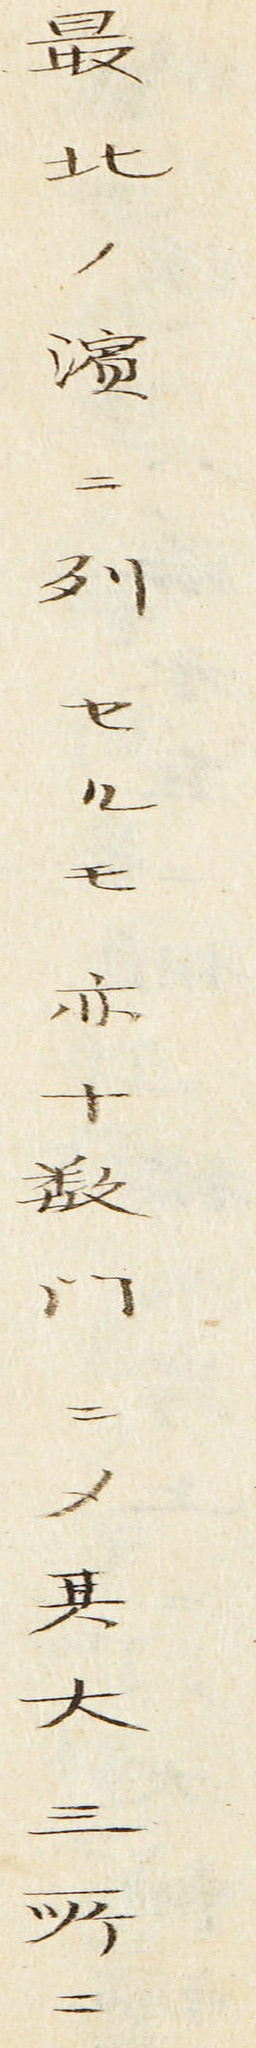最北ノ浜ニ列セルモ亦十数門ニシテ其大三所ニ
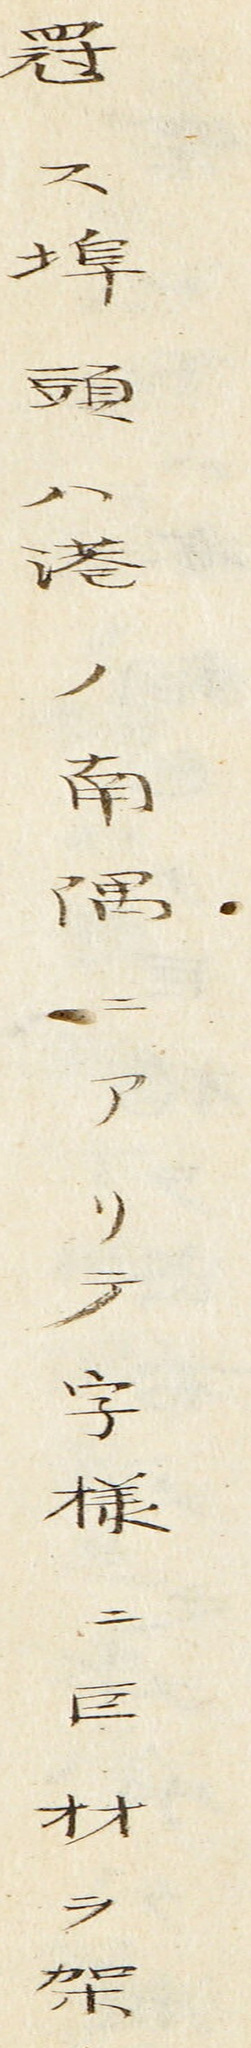ス埠頭ハ港ノ南隅ニアリテ字様ニ巨材ヲ架
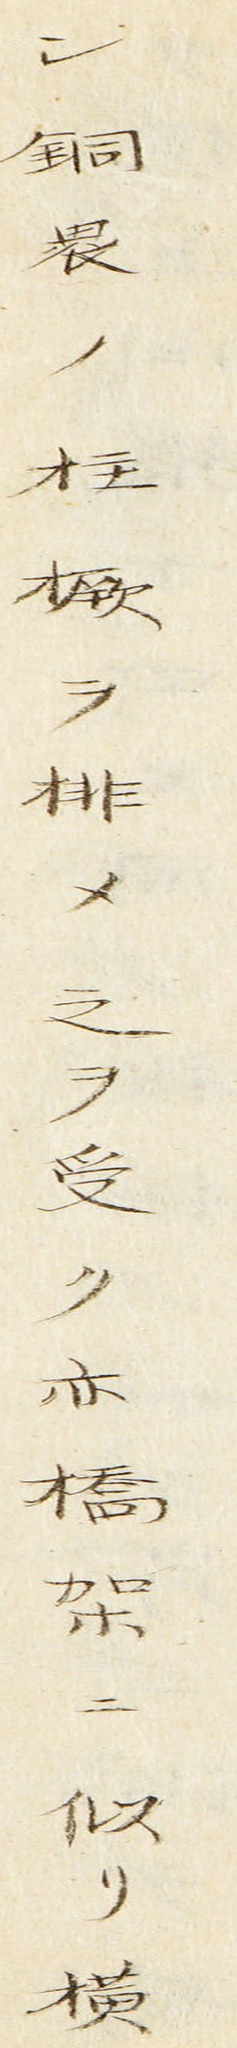ン銅𤱮ノ柱橛ヲ排シテ之ヲ受ク亦橋架ニ似リ横
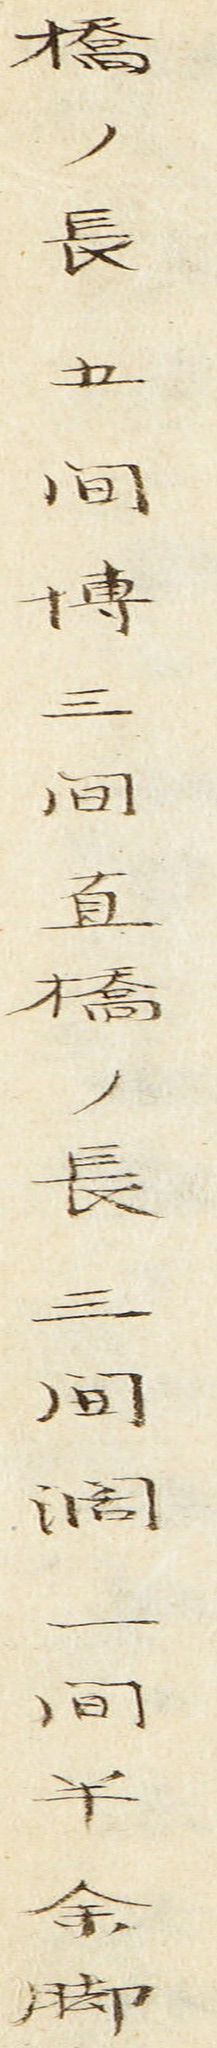橋ノ長五間博三間直橋ノ長三間濶一間半余脚

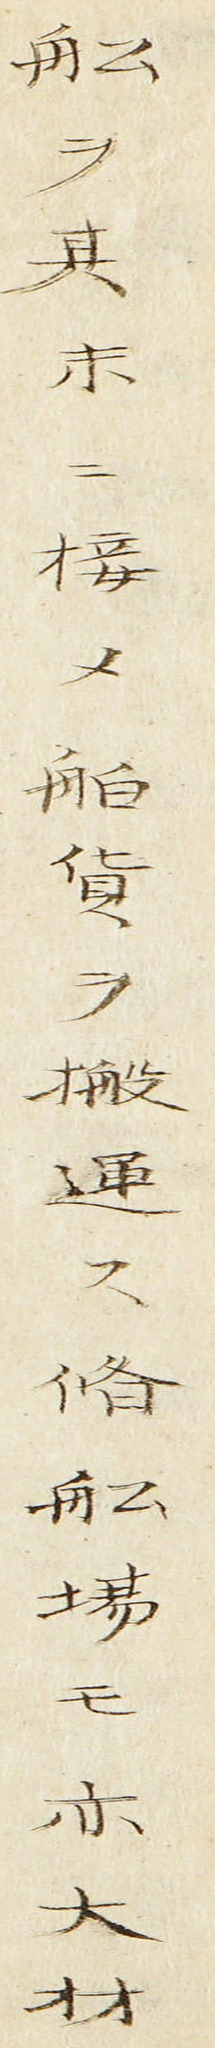船ヲ其末ニ接シテ舶貨ヲ搬運ス修船場モ亦大材
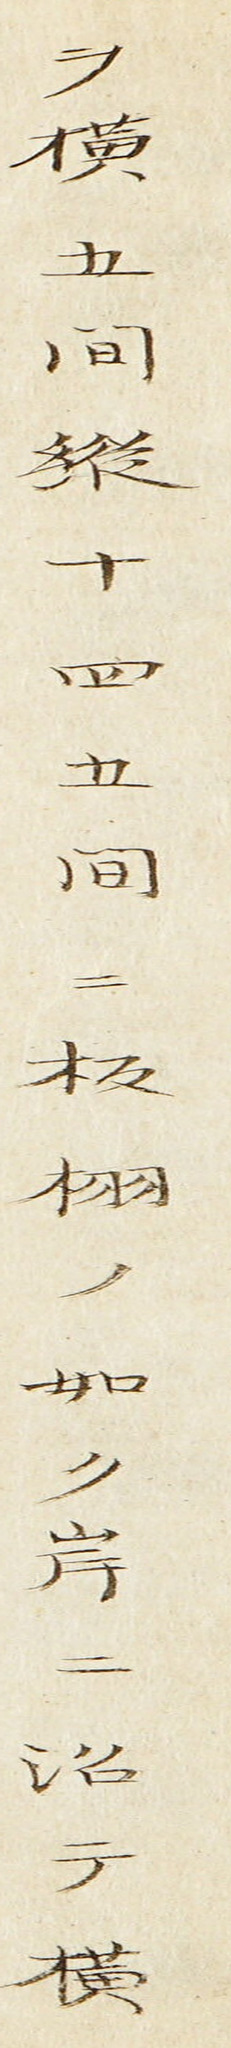ヲ横五間縦十四五間ニ板栩ノ如ク岸ニ沿テ横
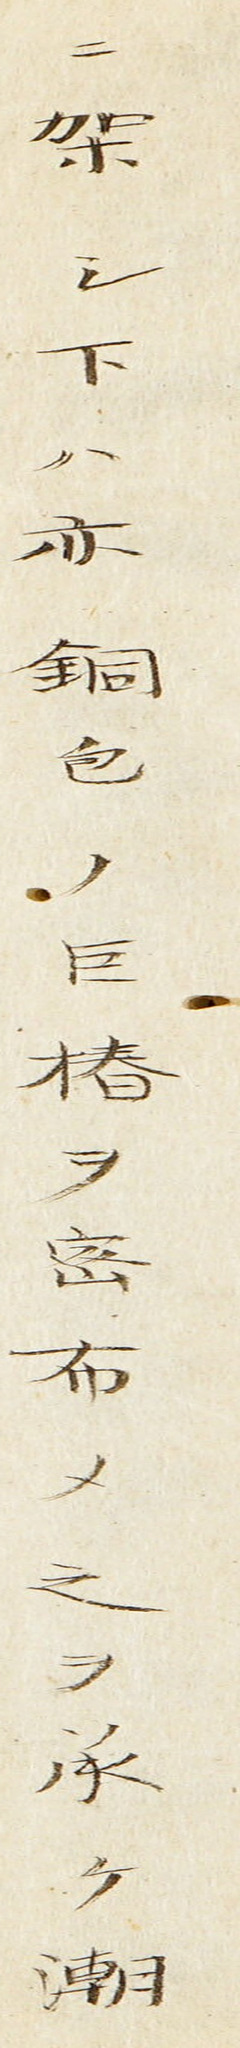ニ架シ下ハ亦銅色ノ巨椿ヲ密布シテ之ヲ承ケ潮
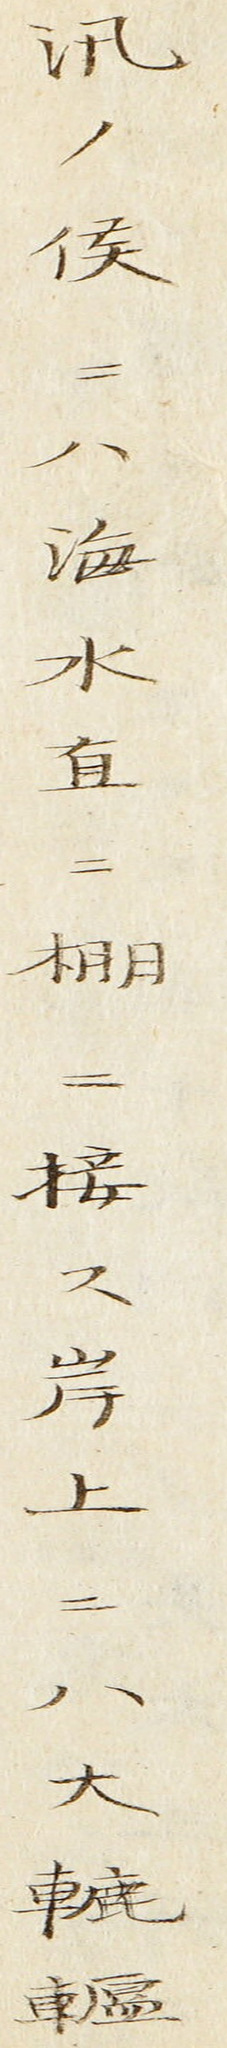汛ノ侯ニハ海水直ニ棚ニ接ス岸上ニハ大轆轤
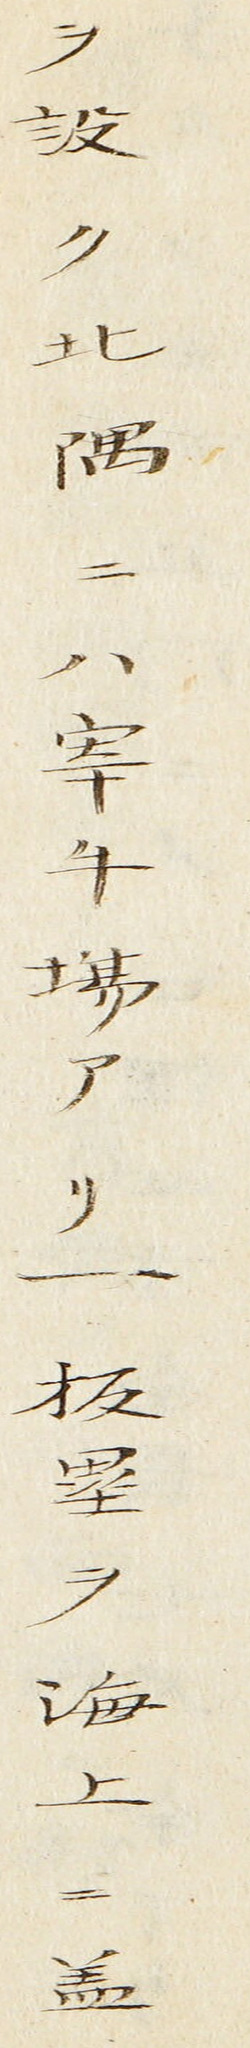ヲ設ク北隅ニハ宰牛場アリ一板塁ヲ海上ニ盖
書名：流蕃通書
